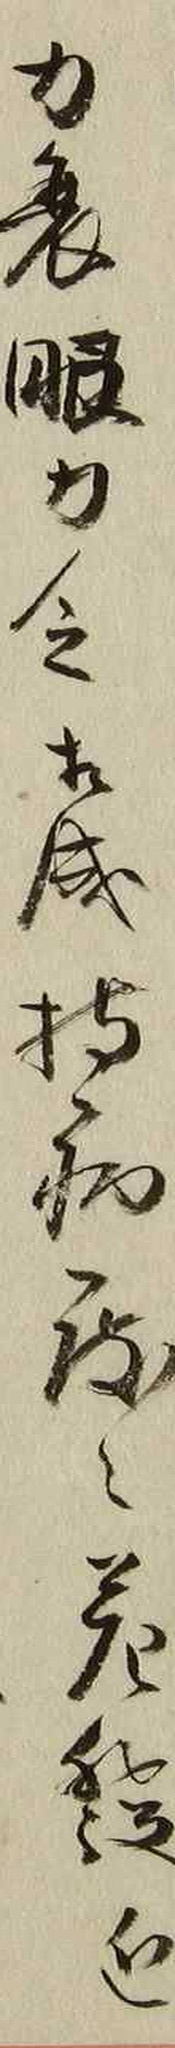力衰眼力令相成持病度々差發近
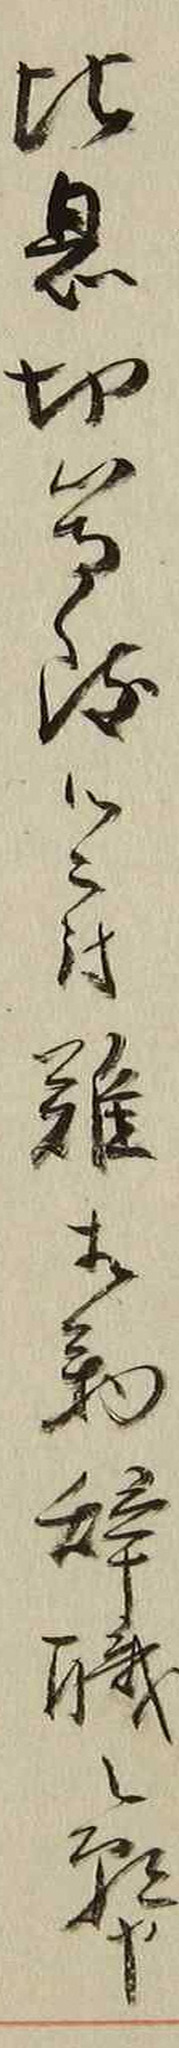比息切等致候に付難相勤辞職之願申
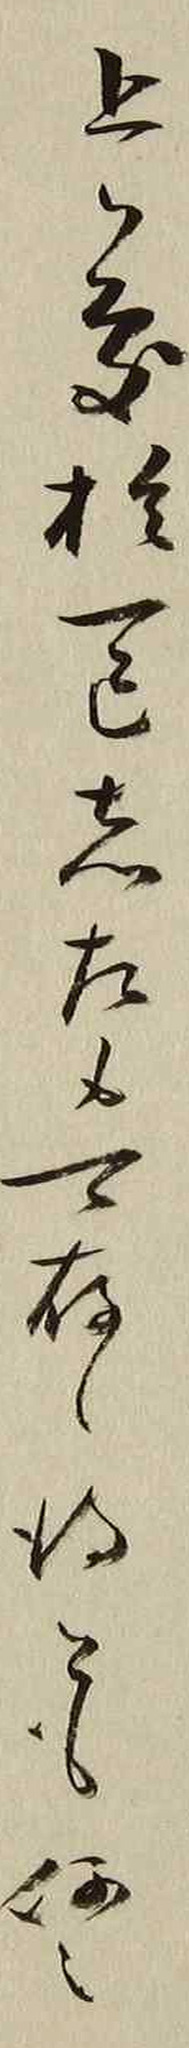上候処於可申は左も可存候得とも何之
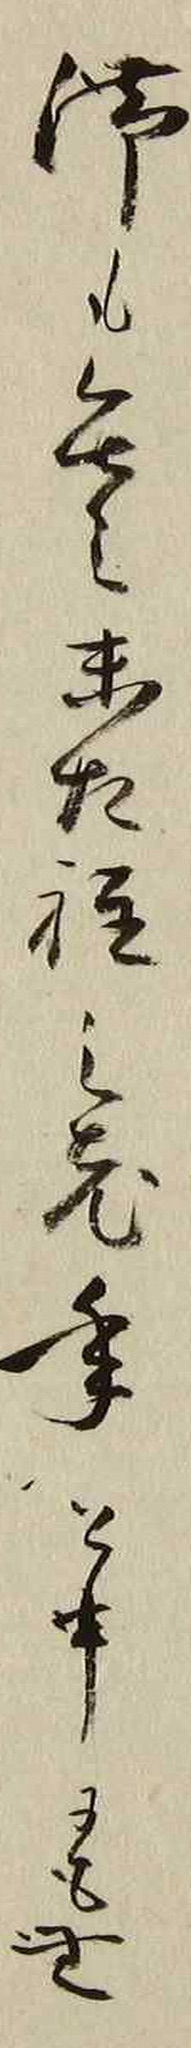滞も無之未左程之老年と申にも無
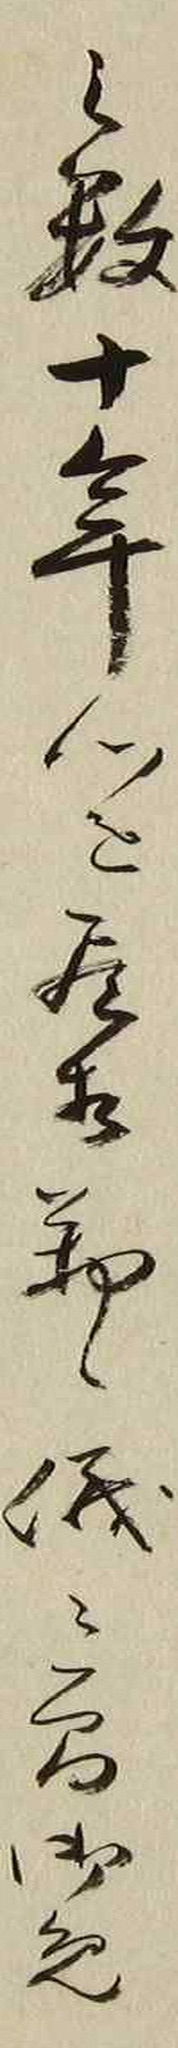之数十年心を尽相勤候儀に候間御免
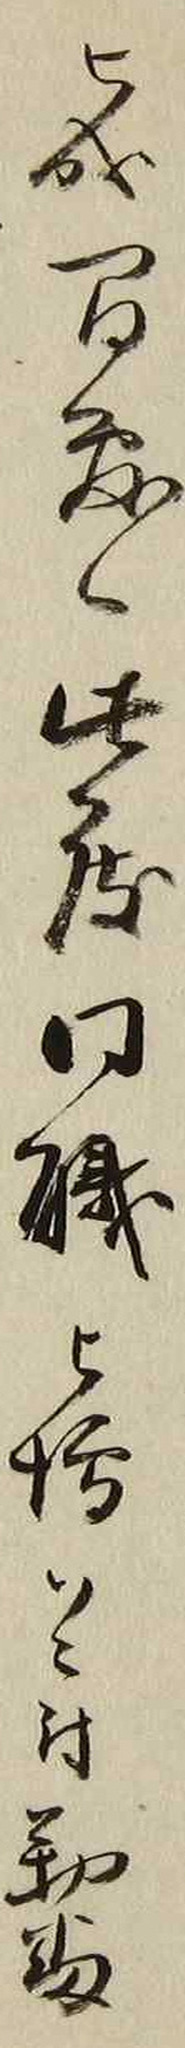被成間敷候此度同職被博候に付勤番
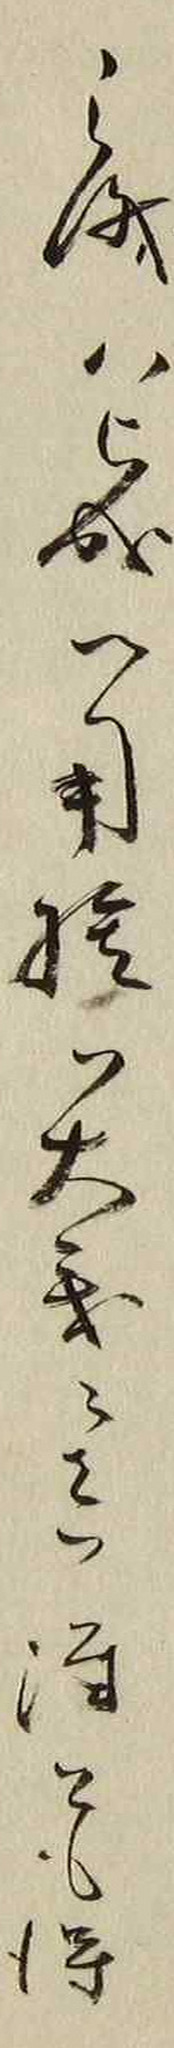之儀は被成御用捨候大義に候得とも得
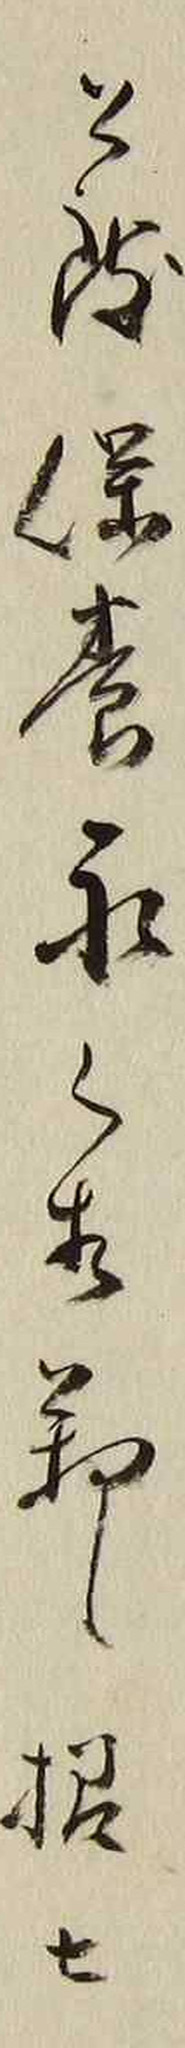と致保養永々相勤候様被
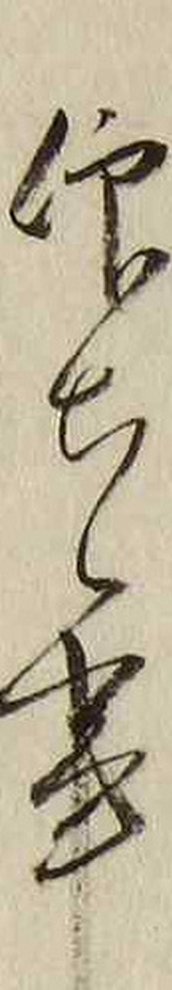仰出候事
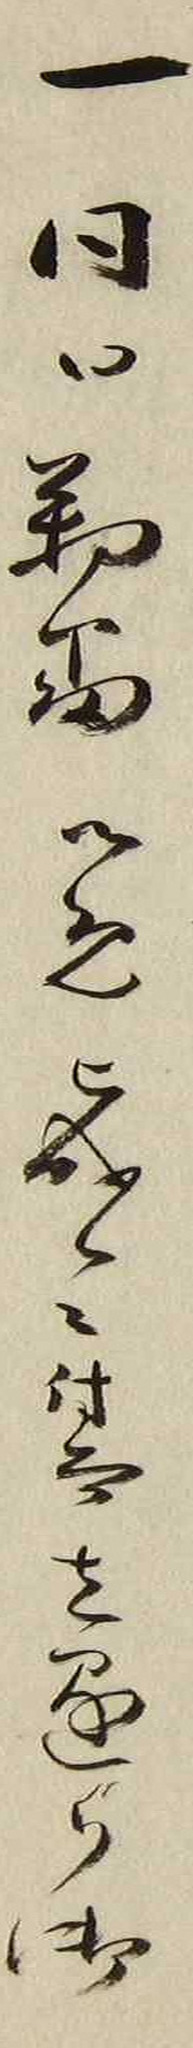一同日勤番御免被成候に付而は懸り御
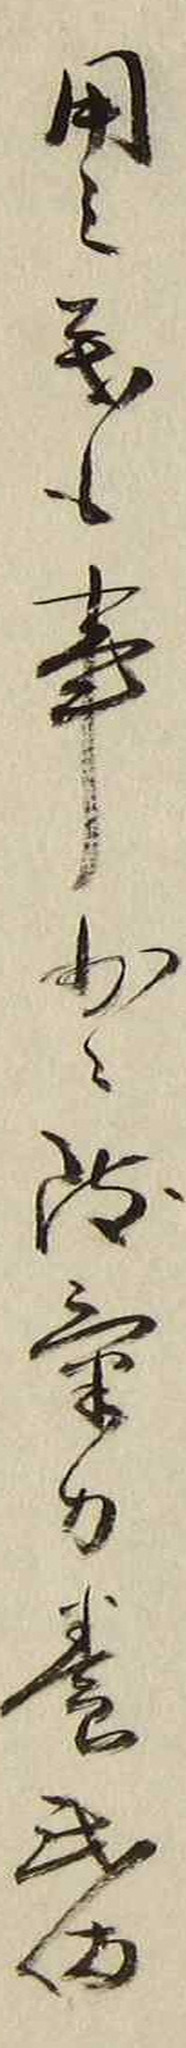用之義も事少々致気力養此備
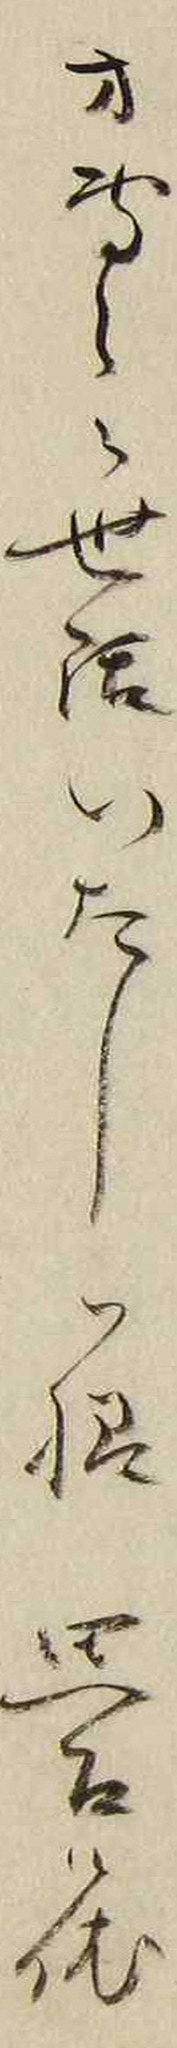方専之世話いたし候様思召候依

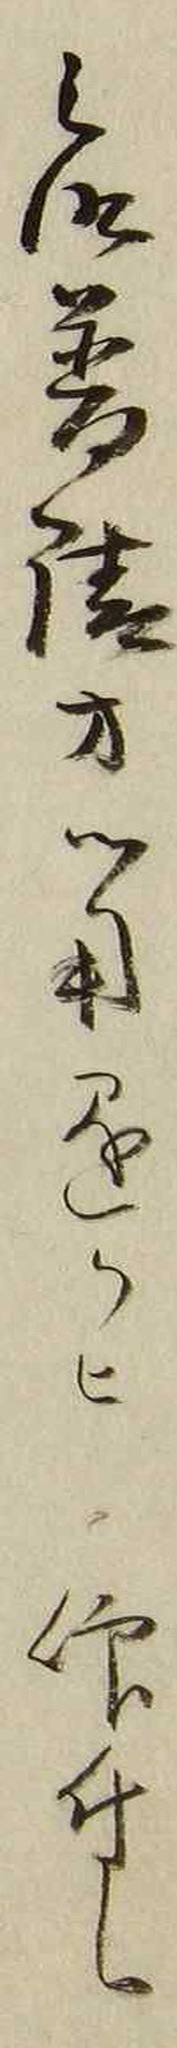之御普請方御用懸り被仰付候
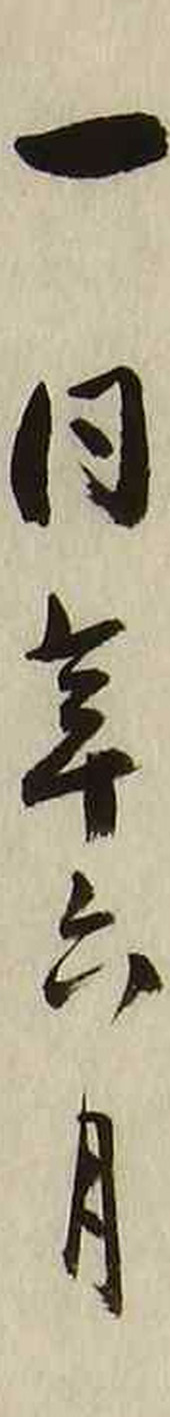一同年六月
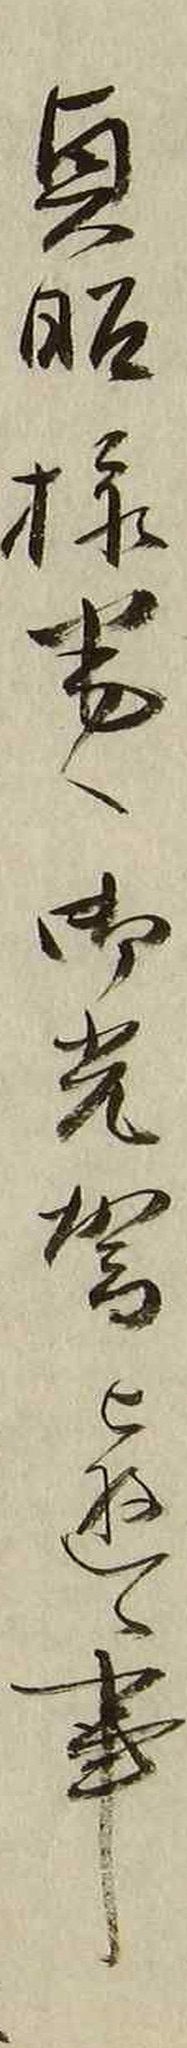貞昭様宅へ御光駕被遊候事
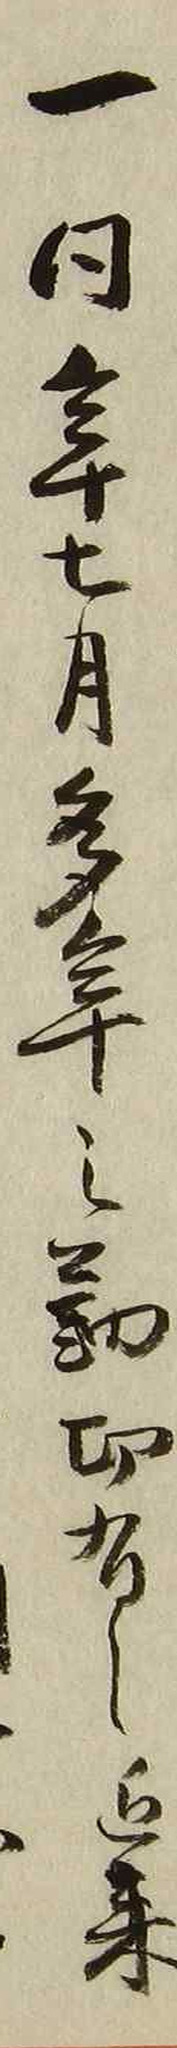一同年七月多年之勤切有之近来
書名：諸士系譜　巻之292　き之部1
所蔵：会津若松市立会津図書館
